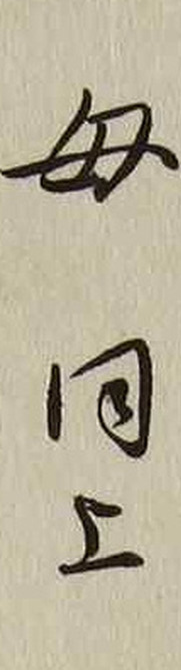母同上
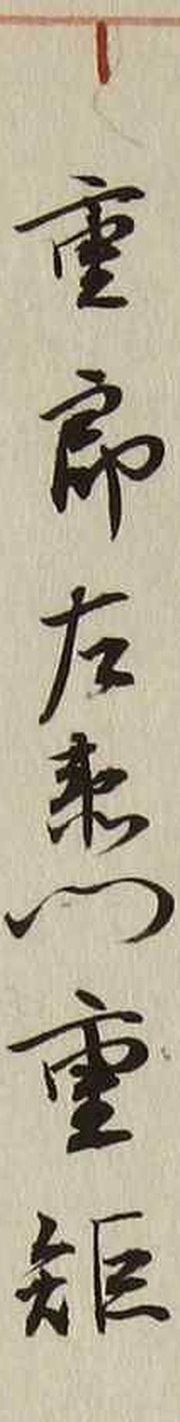重郎左衛門重矩
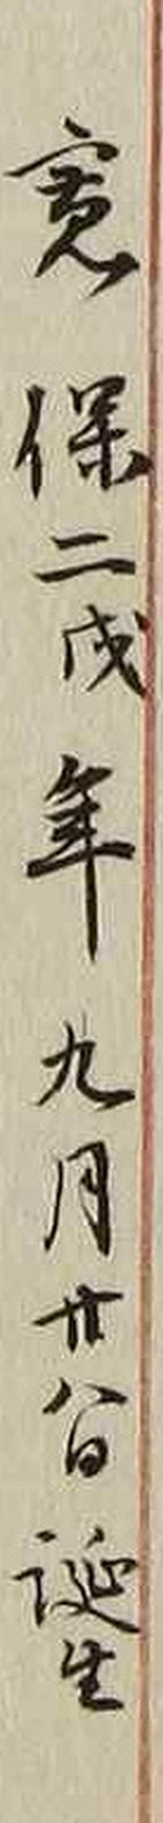寛保二戌年九月廿八日誕生
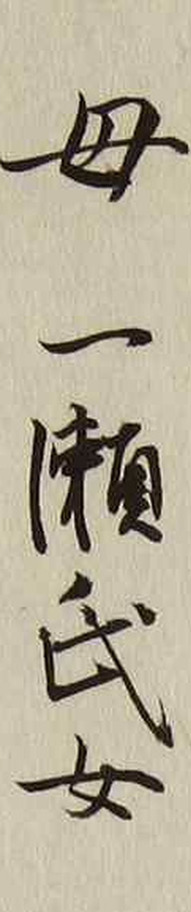母一瀬氏女
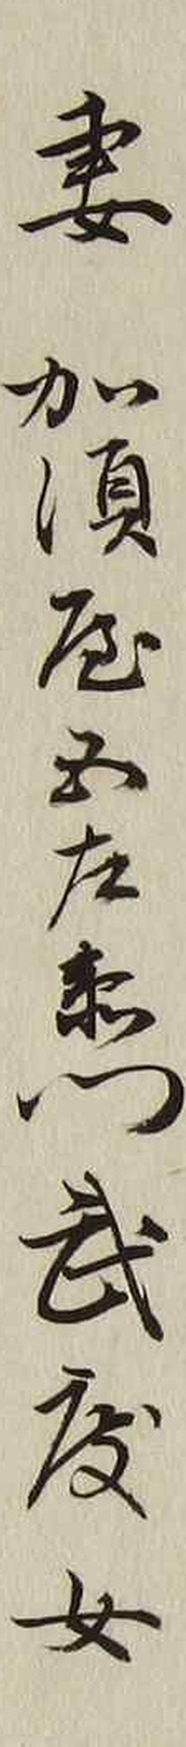妻加須屋五左衛門武度女
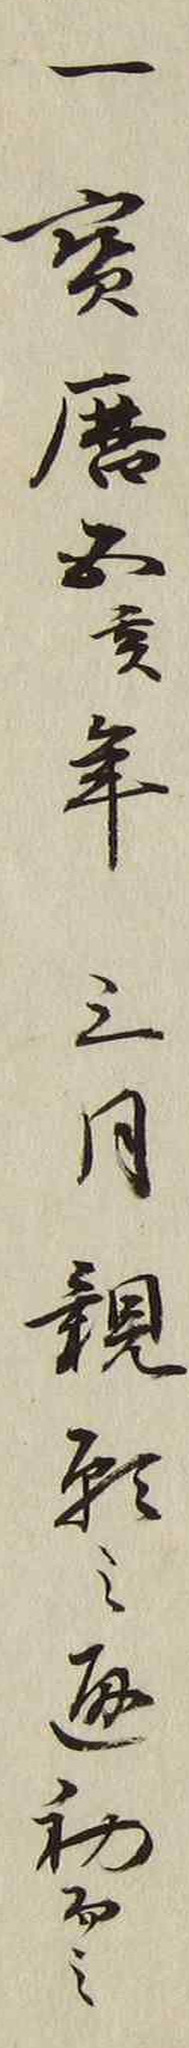一宝暦五亥年三月親願い之通初めて之

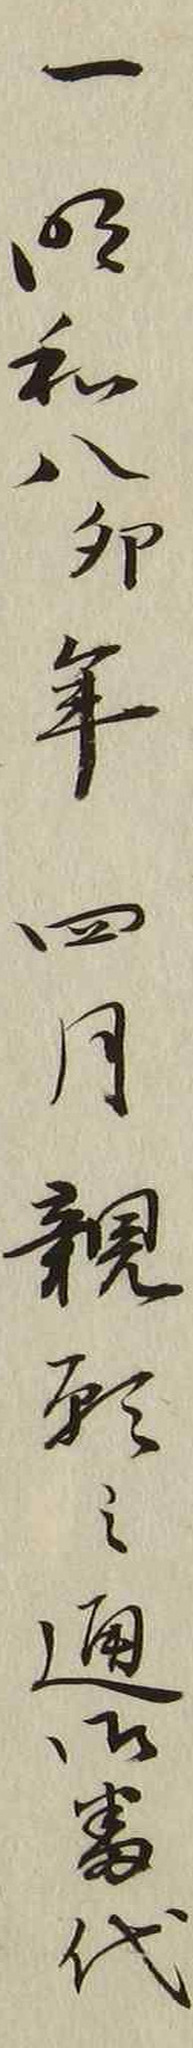一明和八卯年四月親願い之通御番代
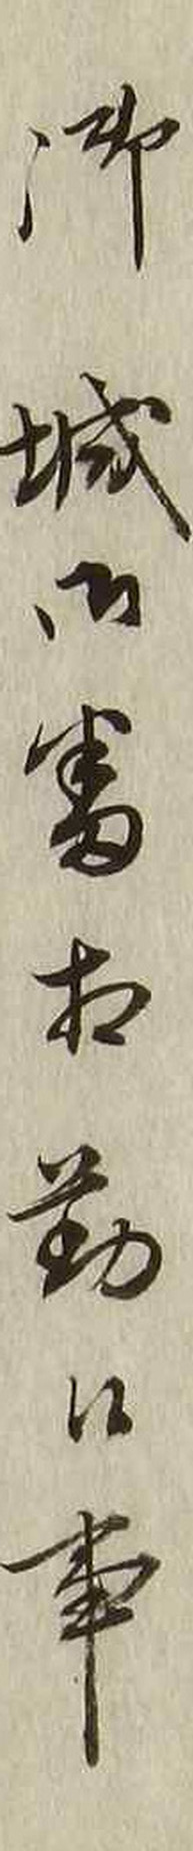御城御番相勤め候事
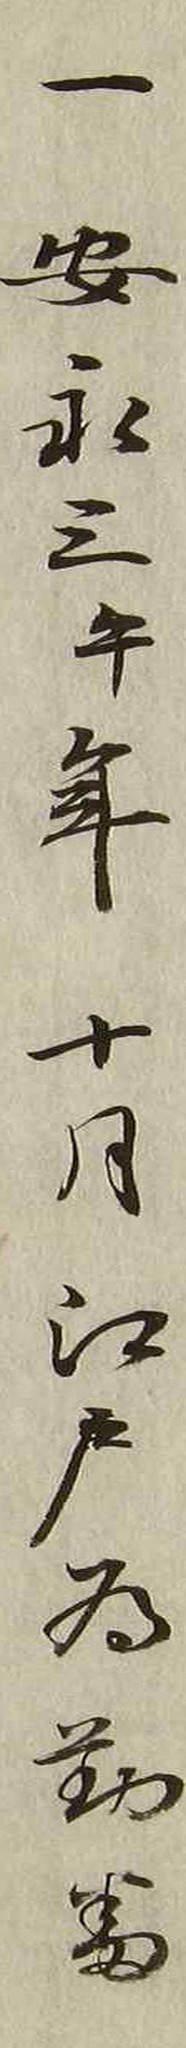一安永午年十月江戸勤番之為
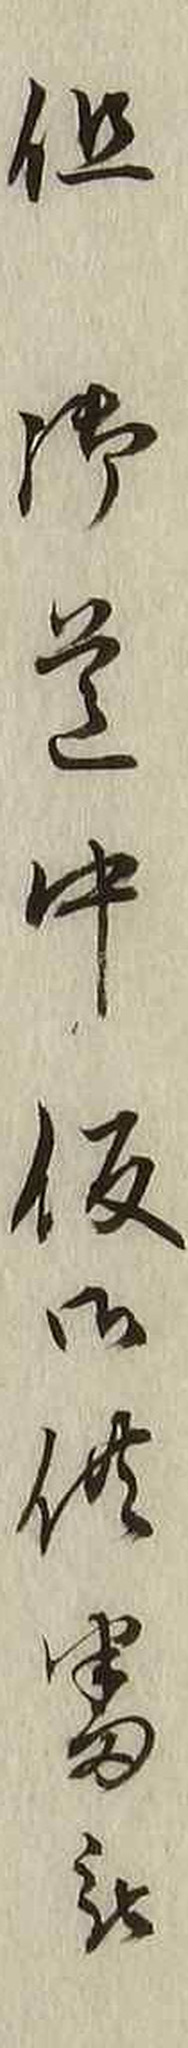但し御道中仮御供番
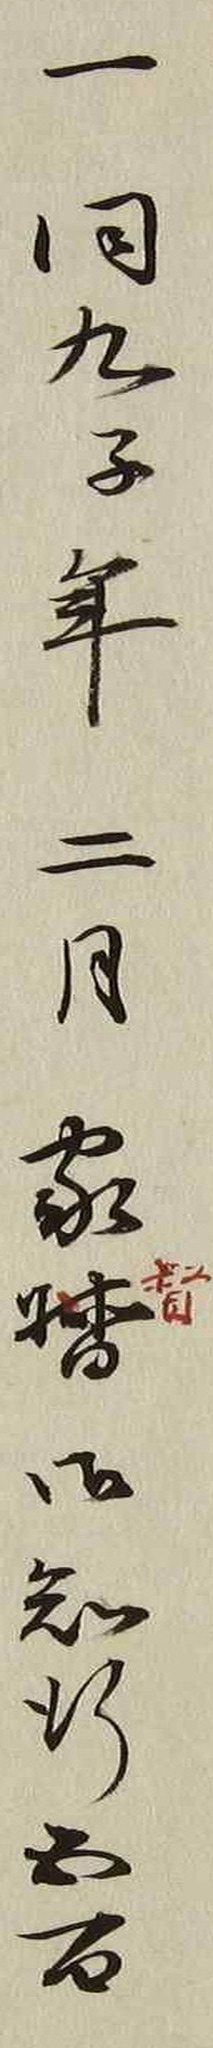一同九子年二月家督御知行五百
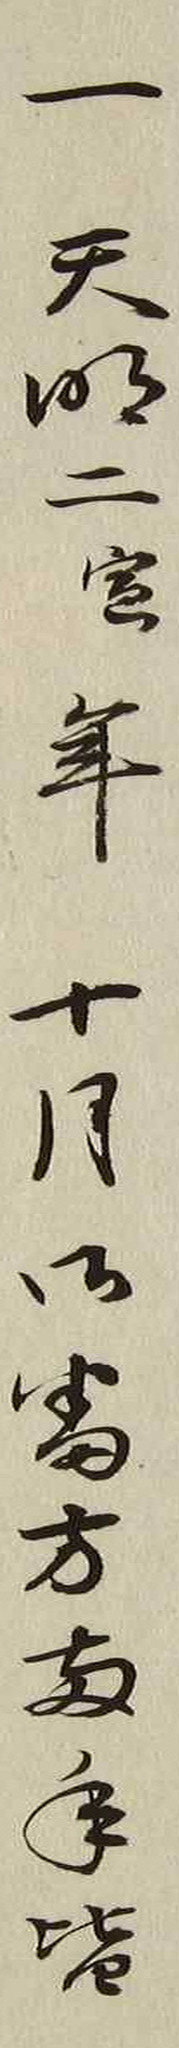一天明二寅年十月御番方両年皆
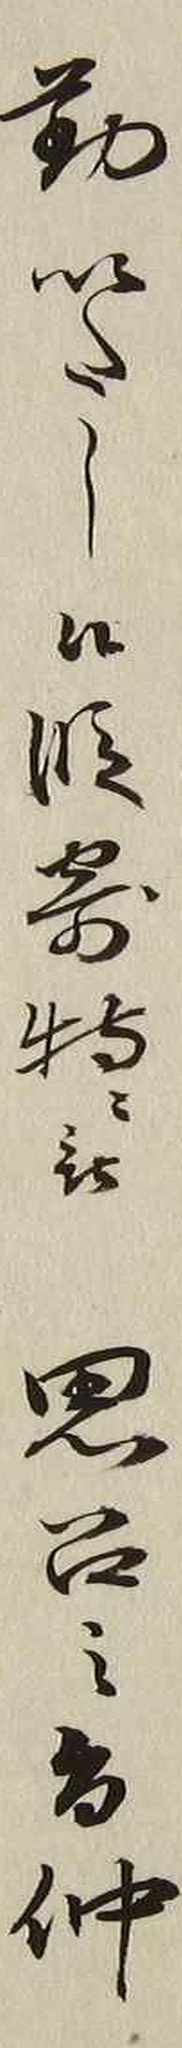勤いたし候段奇特ニ思召され候旨仲
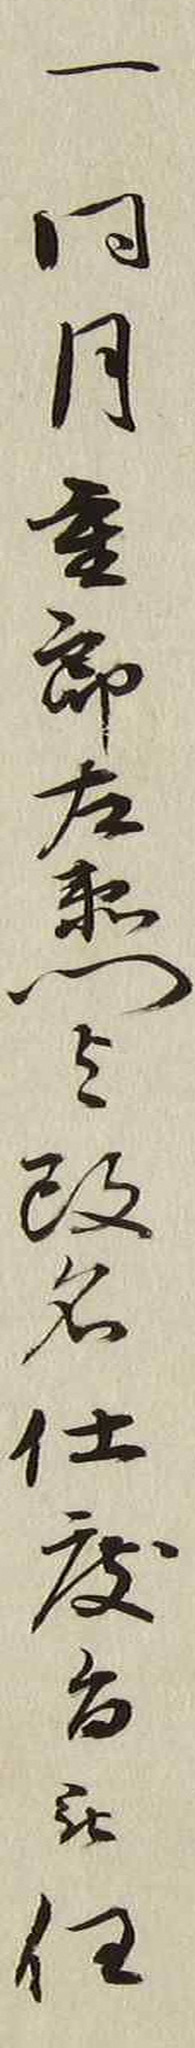一同月重郎左衛門と改名仕り度旨任せ
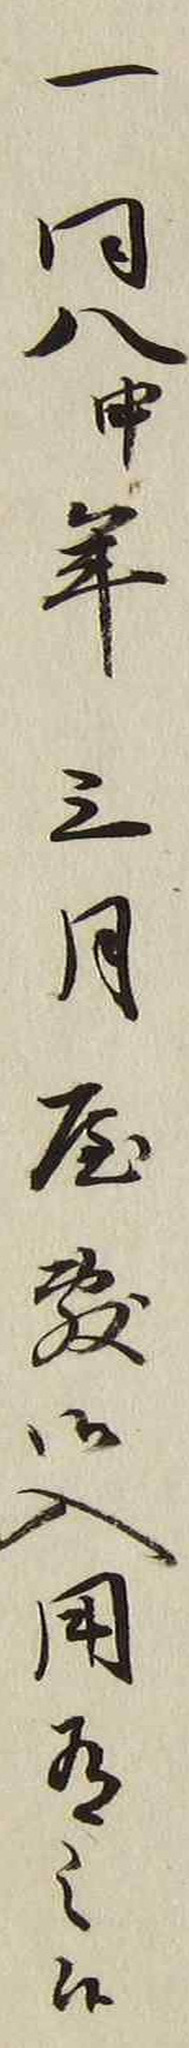一同八申年三月屋敷御入用有之候
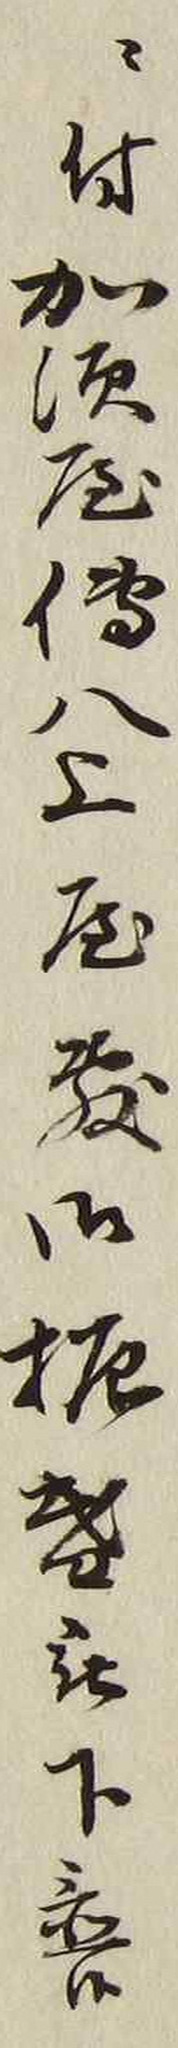ニ付き加須屋傳八上屋敷御振替下し置かれ候
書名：諸士系譜　巻之16　い之部16
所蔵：会津若松市立会津図書館
